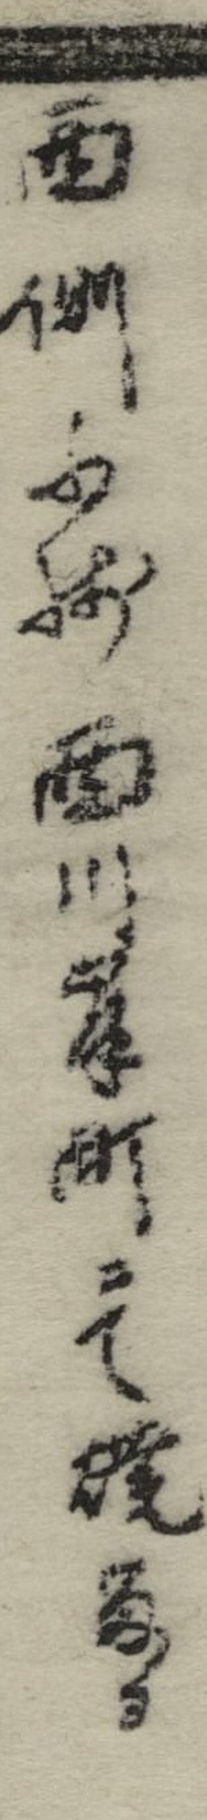西側不残西川岸町にて焼留る
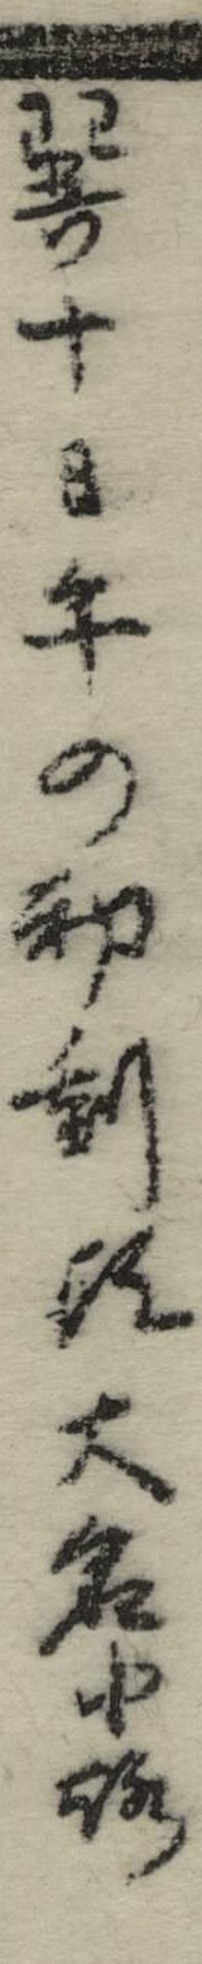翌十日午の初刻頃大名小路
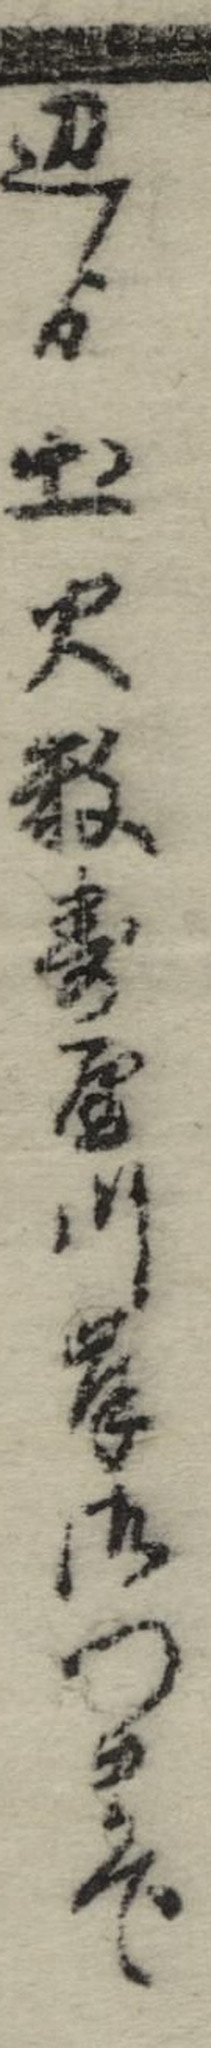辺ゟ出火数寄屋川岸御門まで
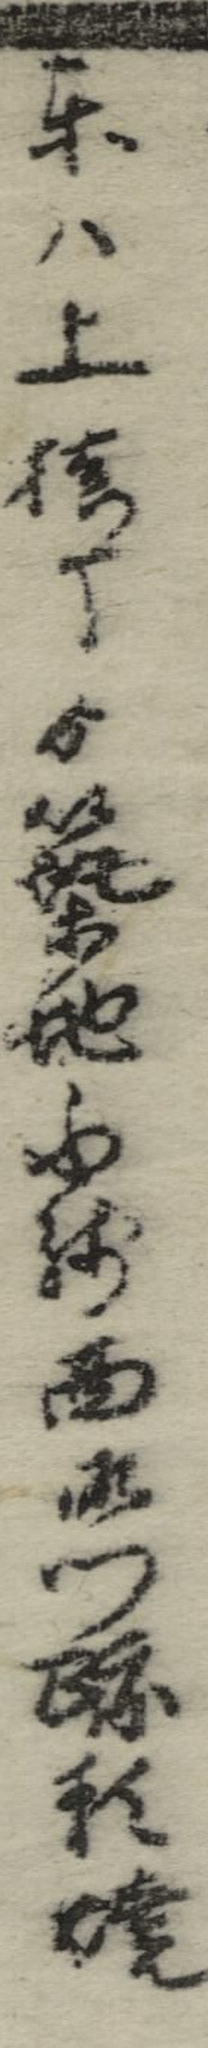東は上槙町ゟ築地不残西御門跡類焼
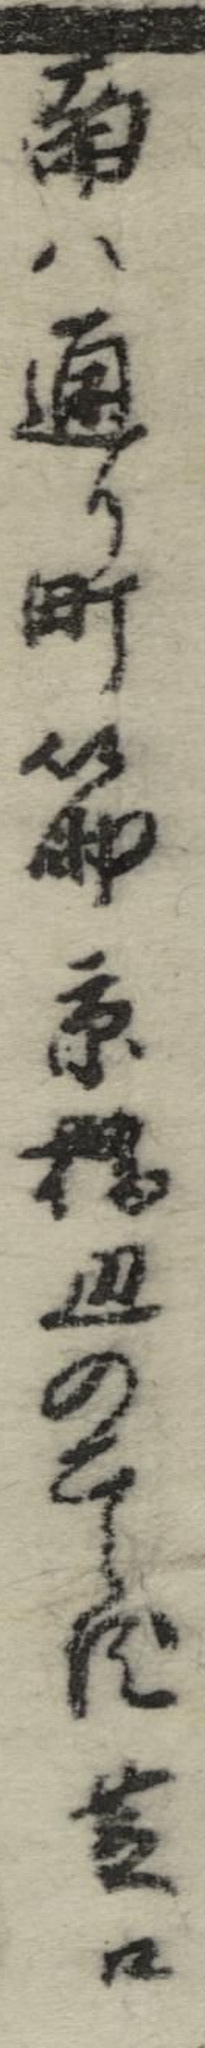南は通り町筋京橋辺のこらず芝口
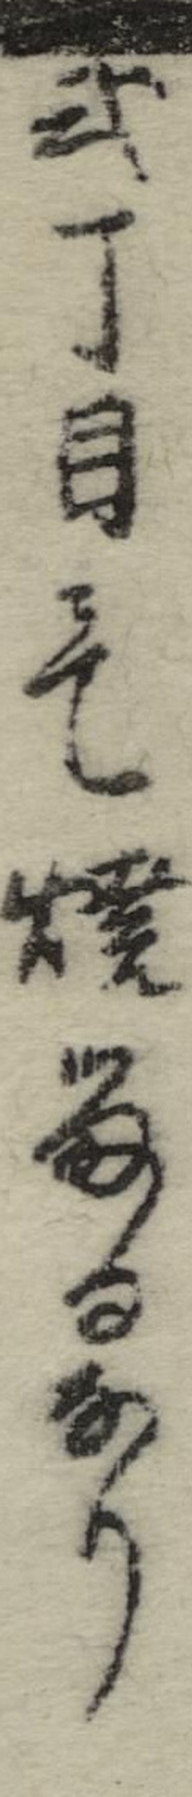弐丁目にて焼留るなり
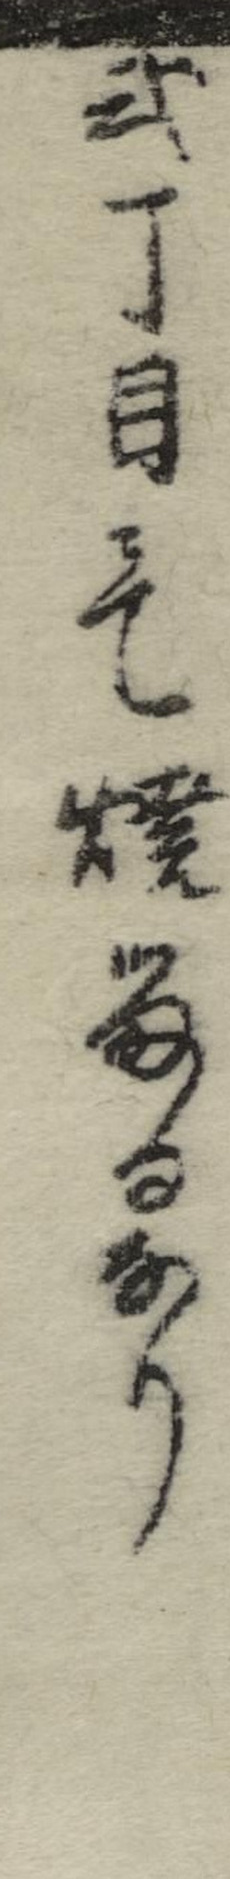弐丁目にて焼留るなり
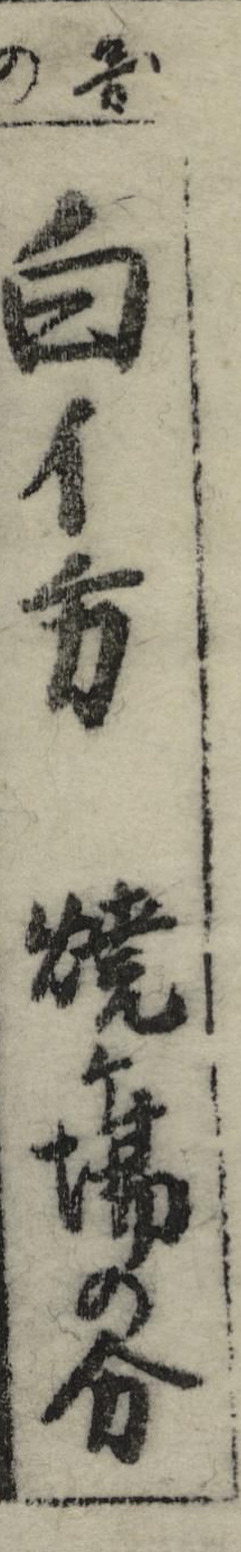白イ方焼ヶ場の分
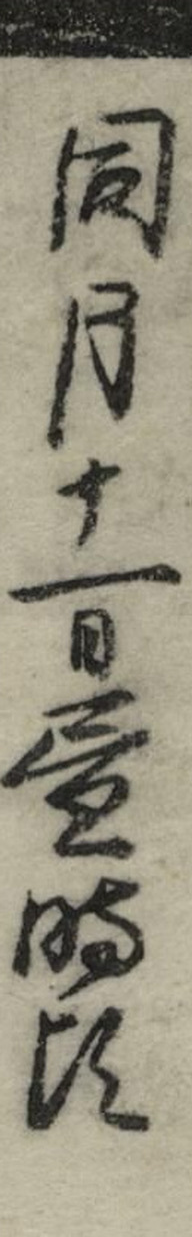同月十一日昼時頃
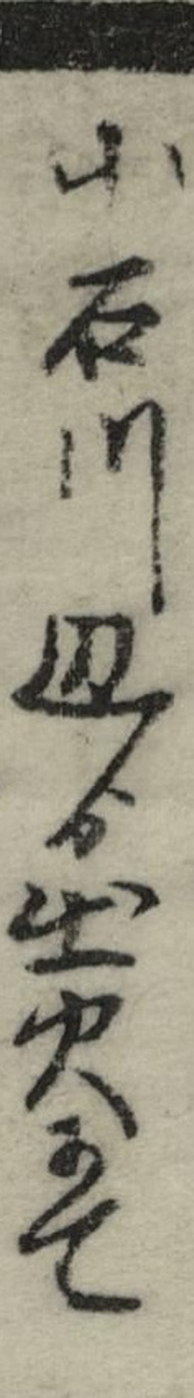小石川辺ゟ出火にて
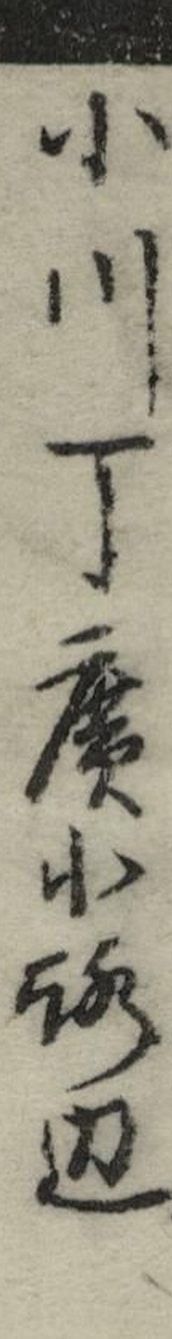小川丁広小路辺
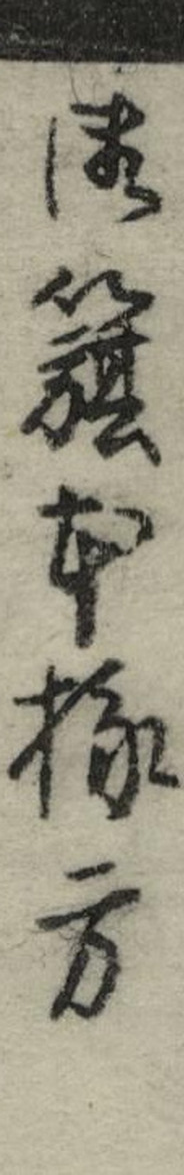御簱本様方
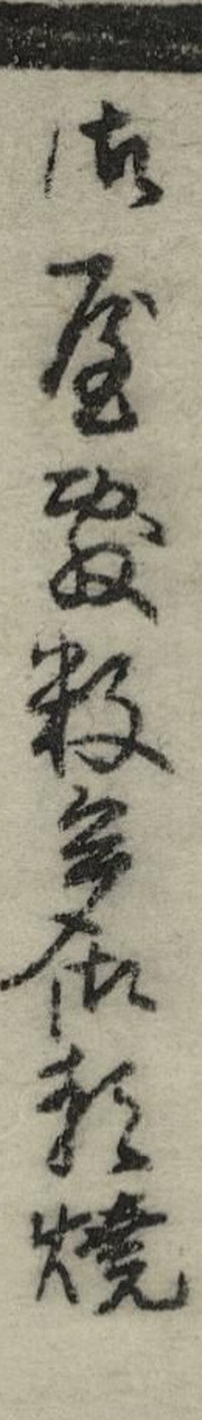御屋敷数多御類焼
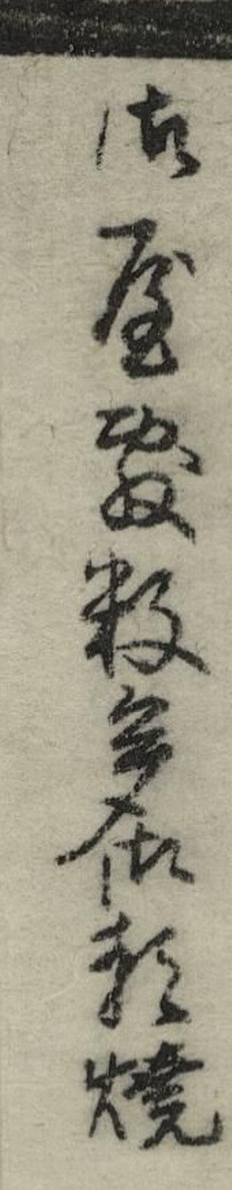御屋敷数多御類焼
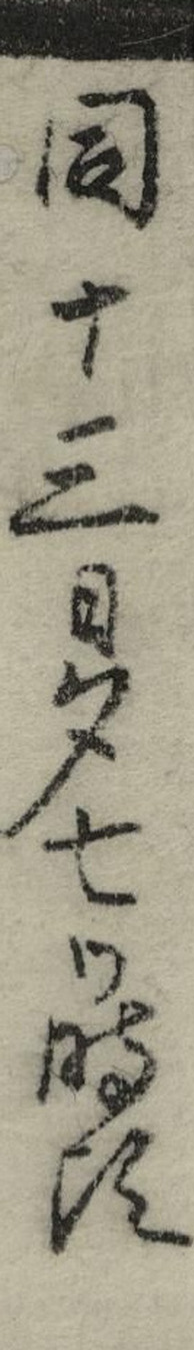同十三日夕七ッ時頃
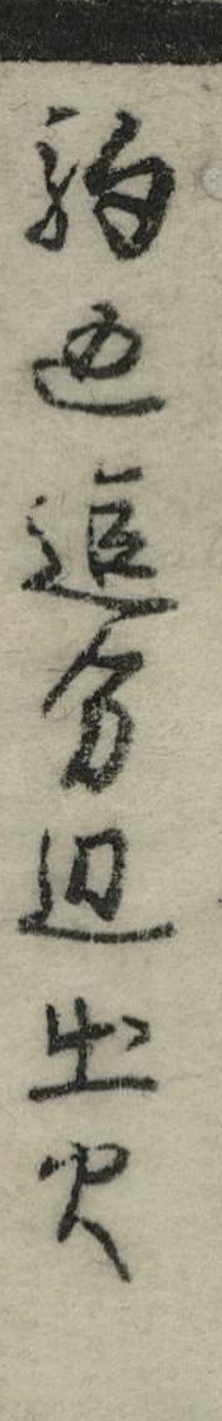駒込追分辺出火
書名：[天保五年二月の江戸大火に関する瓦版]
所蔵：東京大学地震研究所図書室 Earthquake Research Institute Library, The University of Tokyo, JAPAN
